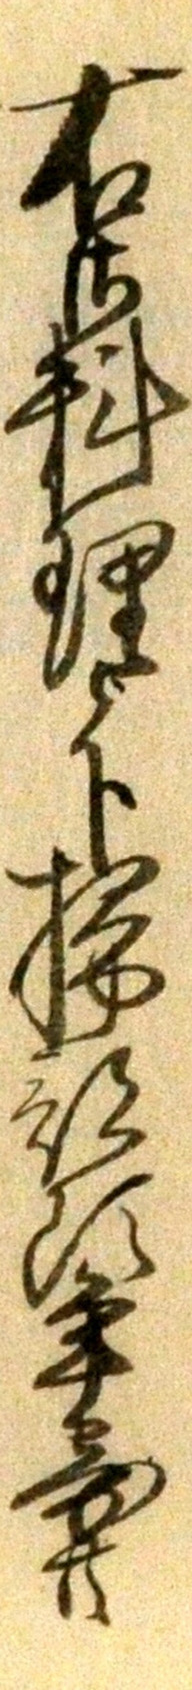右御料理被下掃部頭年寄共
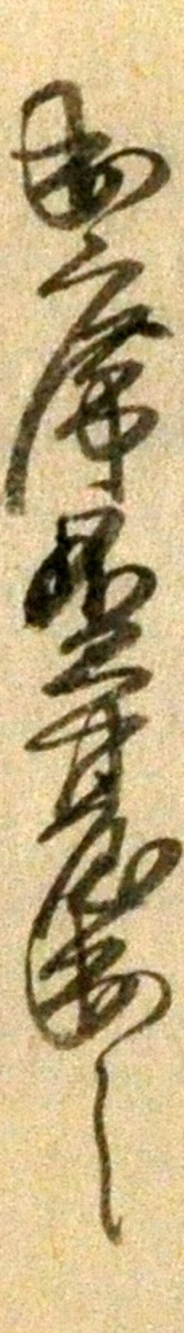出席盃台出之
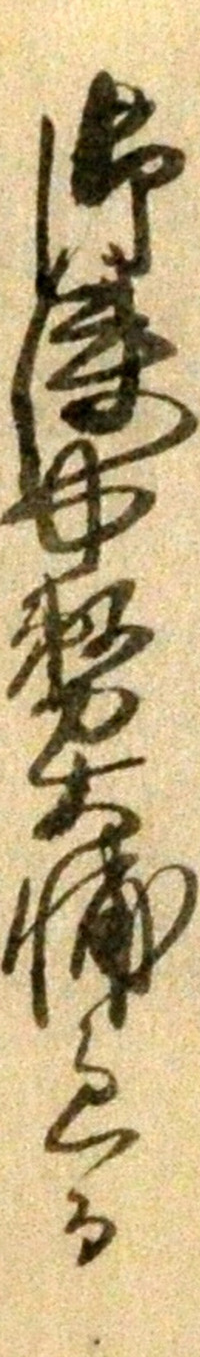御使中務大輔過而
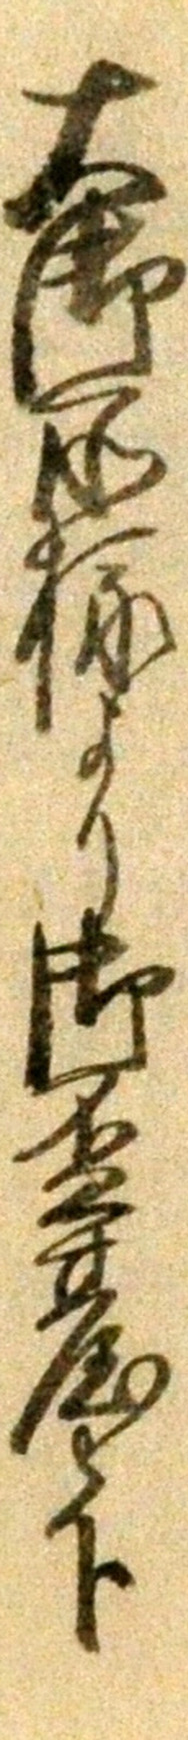大御所様より御盃台被下
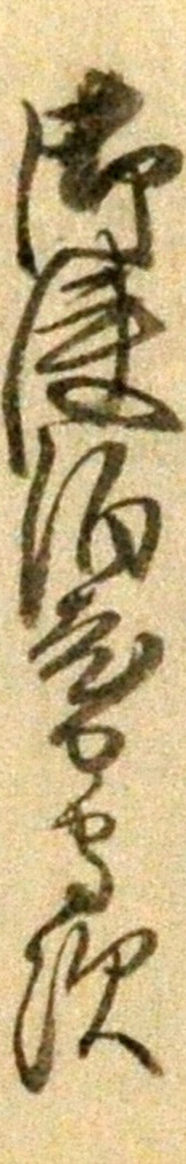御使伯耆守次
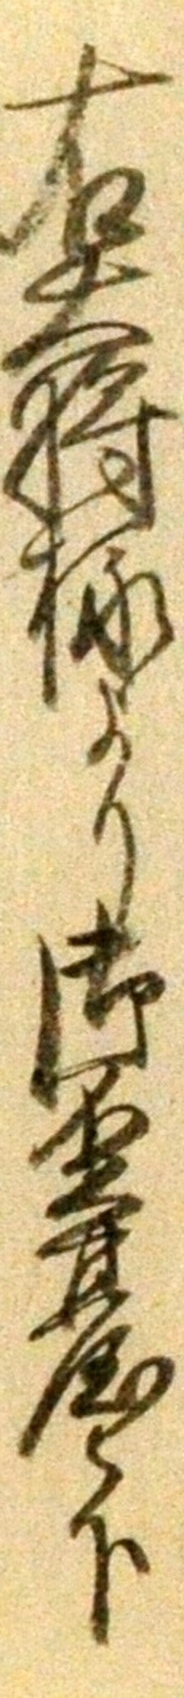右大将様より御盃台被下
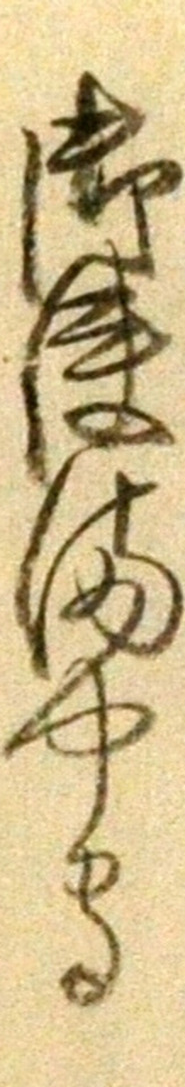御使備中守

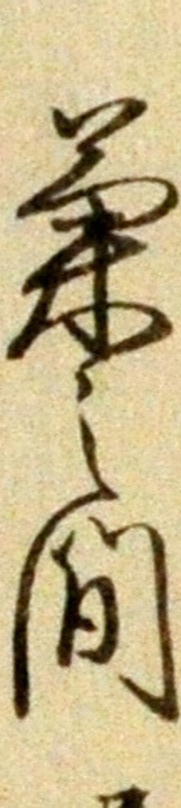柳之間
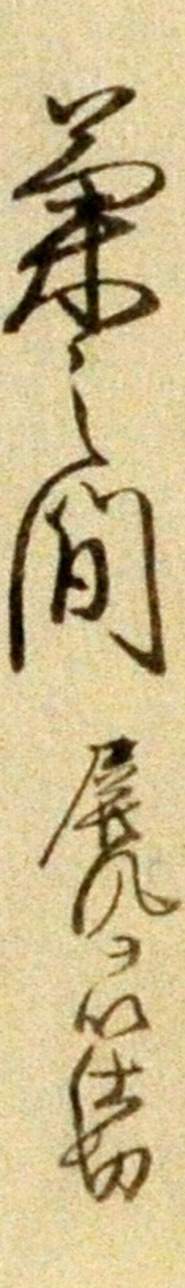菊之間屏風ヲ以仕切
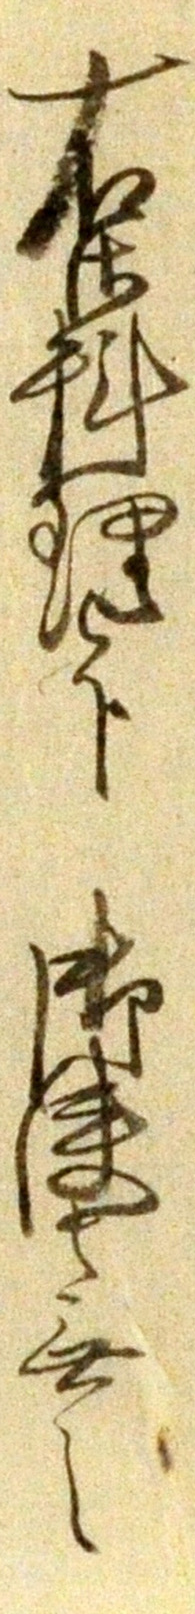右御料理被下御使は無之
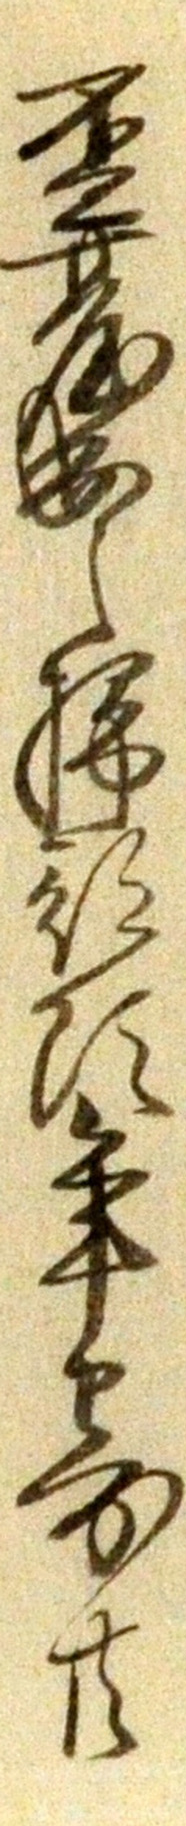盃台出之掃部頭年寄共
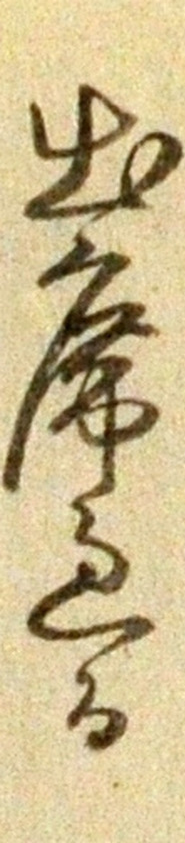出席過而
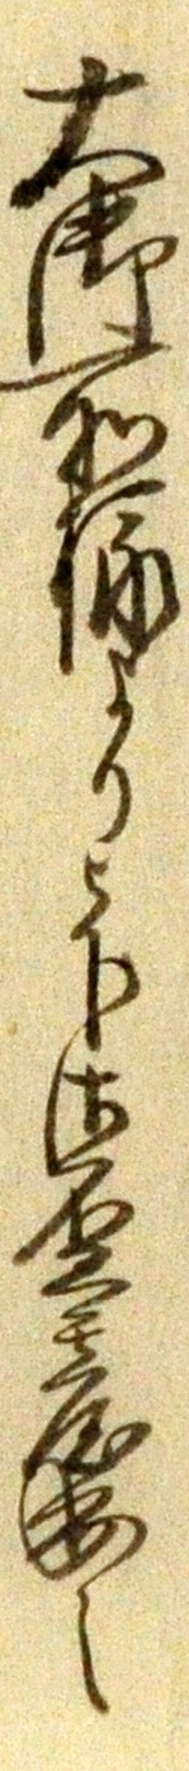大御所様より被下御盃台出之
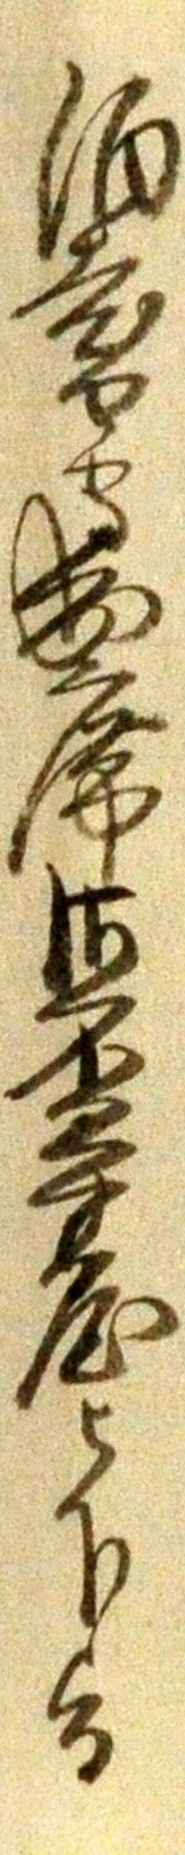伯耆守出席御盃台被下旨
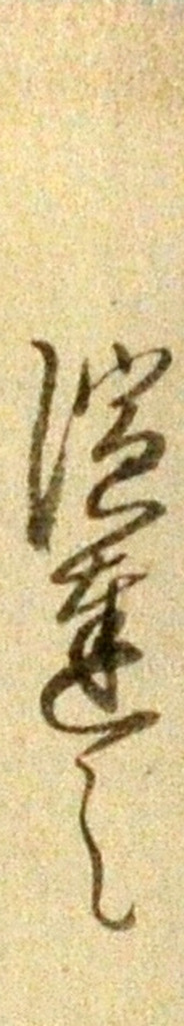演達之
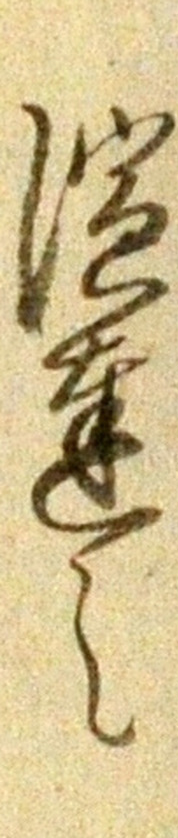演達之
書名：御馳走御能ノ節ノ留外
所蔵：伊那市立高遠町図書館・合同会社AMANE
